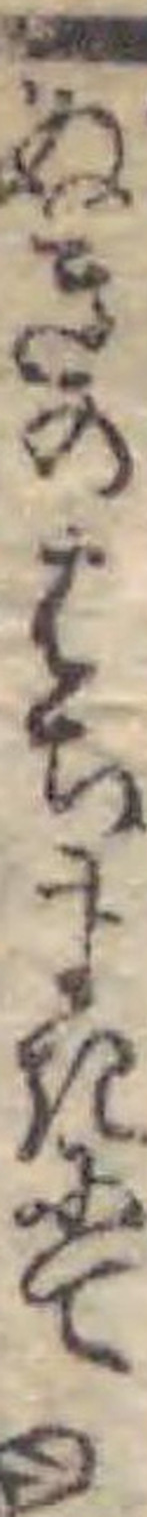ぬきのはちまきにて
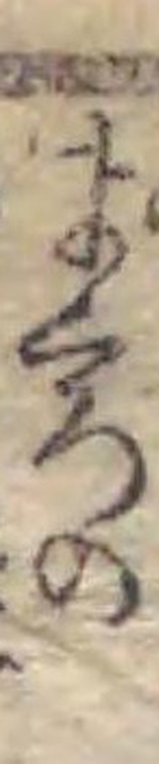まくろの
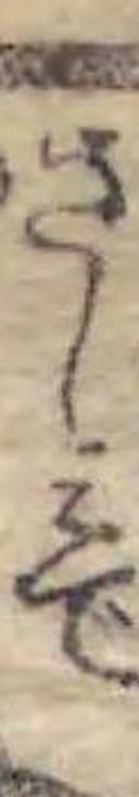さしみで
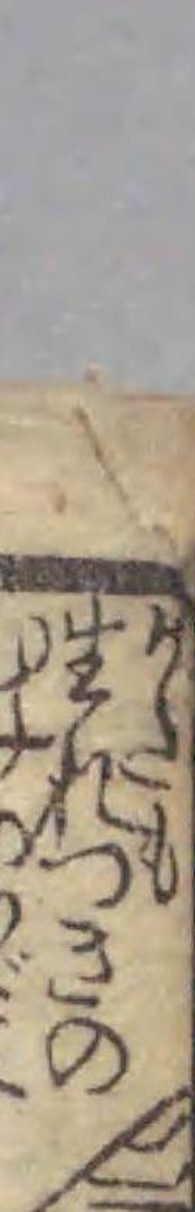生れつきの
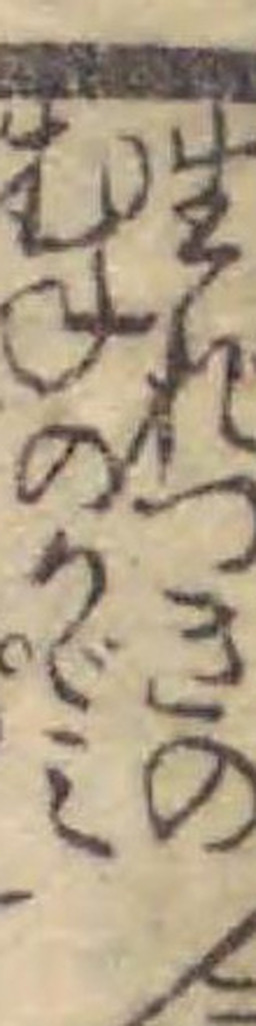むねのかゞみ
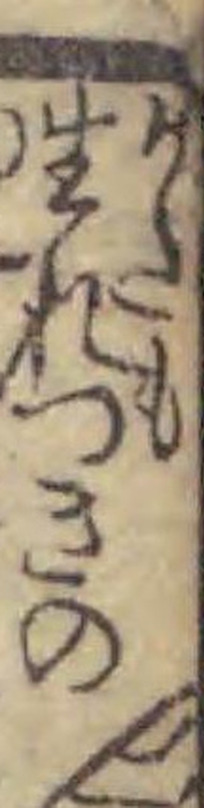生れつきの
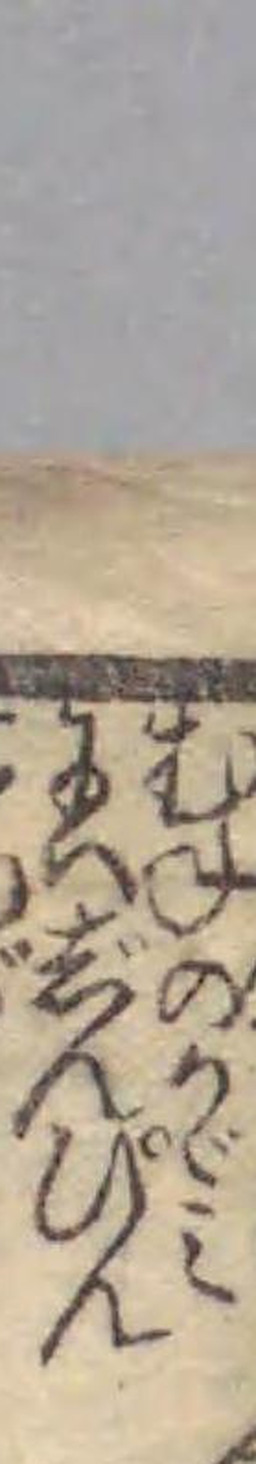にはじんぴん
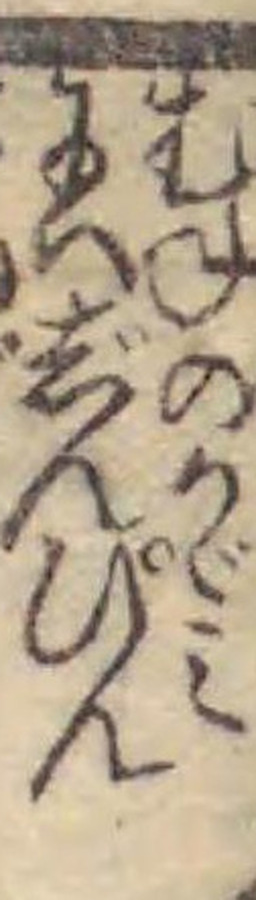にはじんぴん
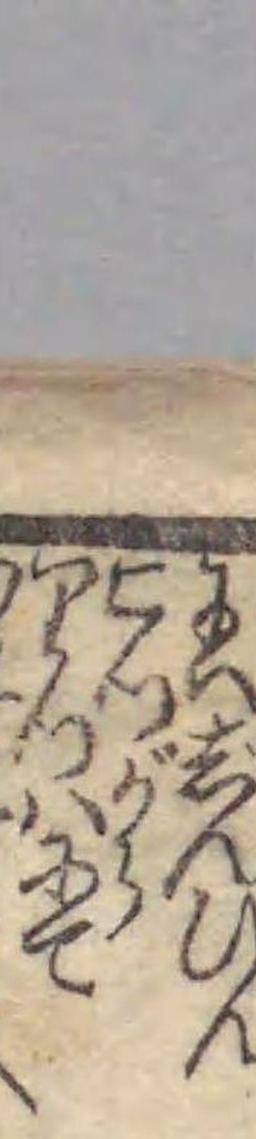りつはにて
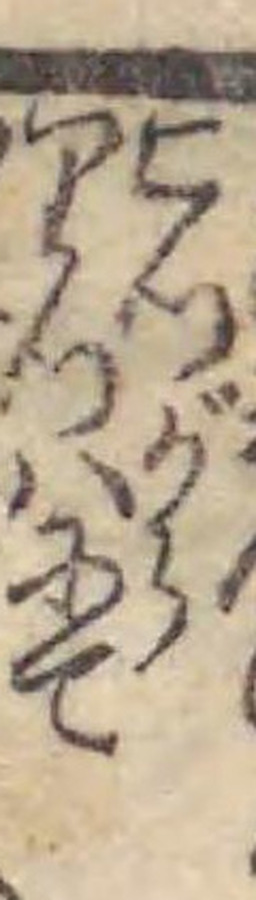りつはにて
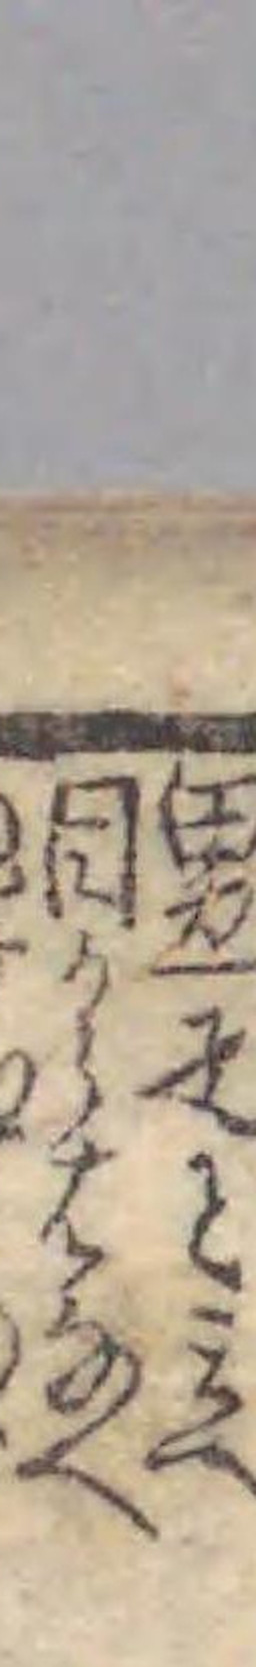目からはなへ
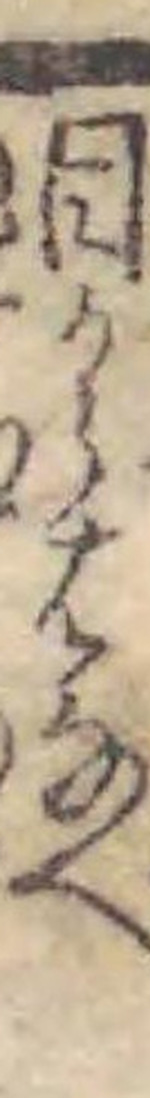目からはなへ
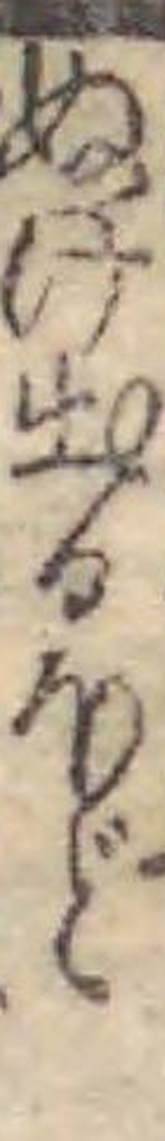ぬけ出るほど
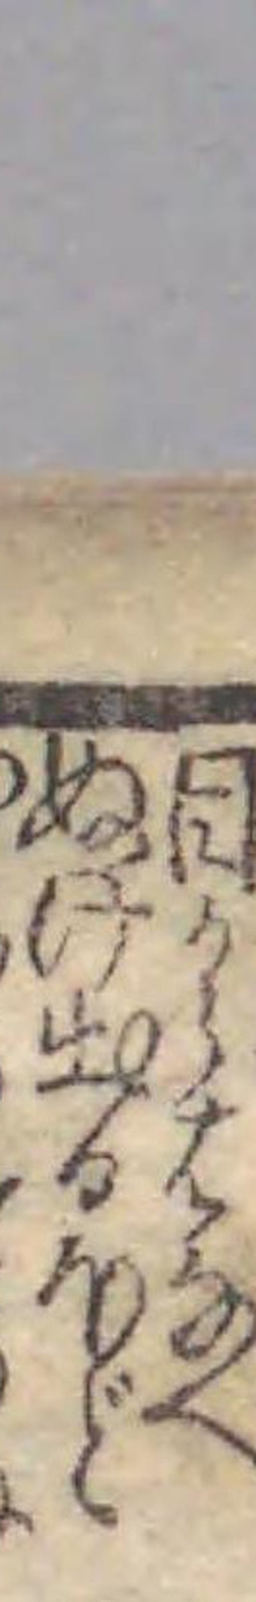ぬけ出るほど
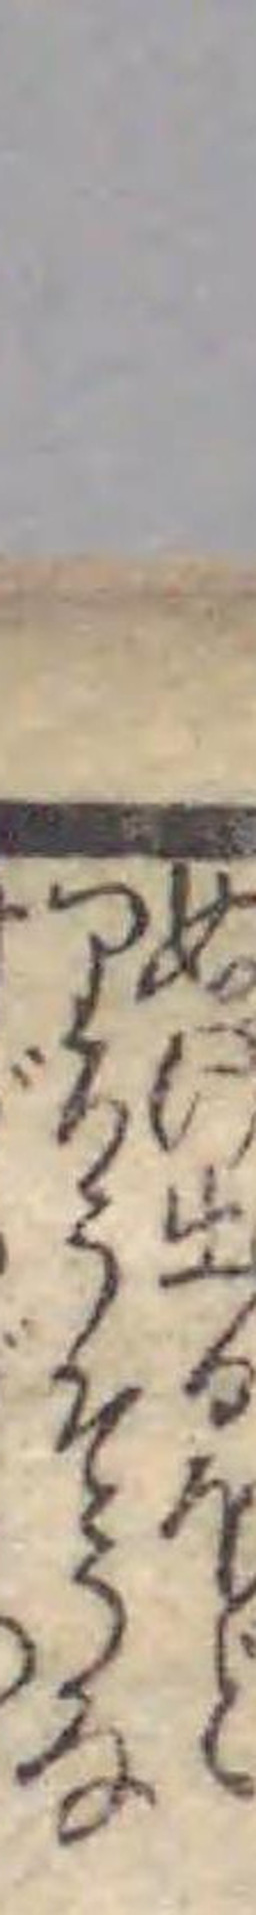りかうそうな
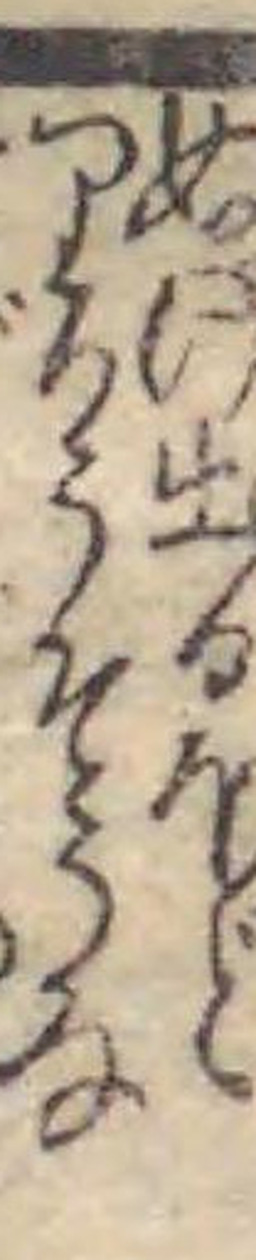りかうそうな
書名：人心鏡写絵 : 3巻
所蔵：国立国会図書館 National Diet Library, JAPAN
